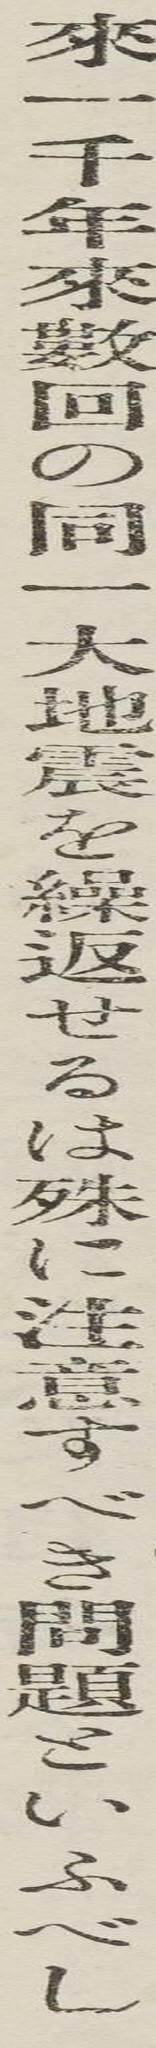来一千年来数回の同一大地震を繰返せるは殊に注意すべき問題といふべし
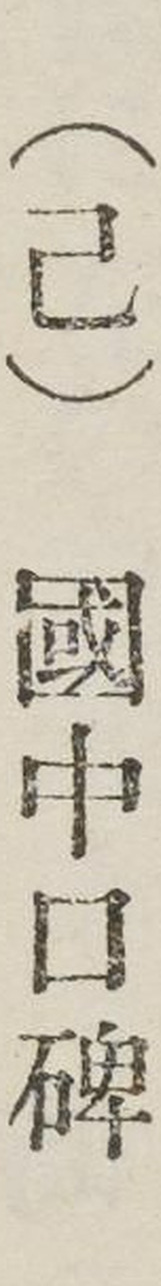国中口碑
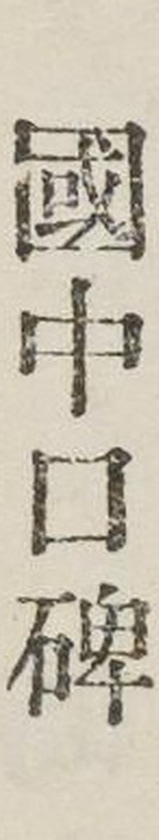国中口碑
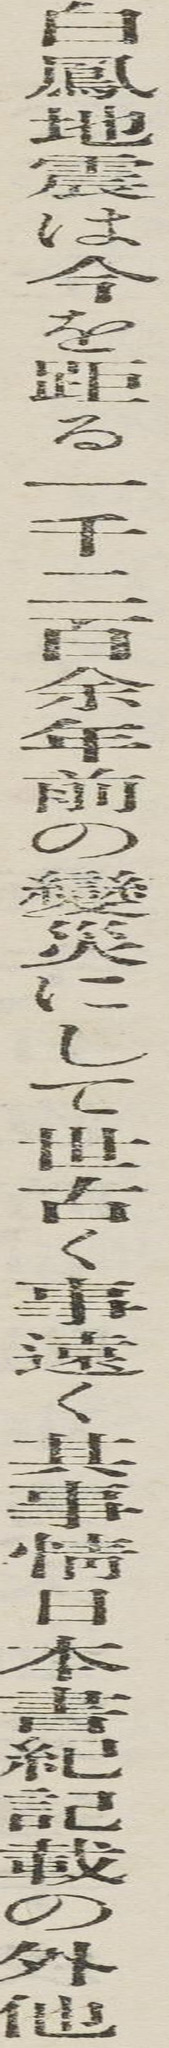白鳳地震は今を距る一千二百余年前の変災にして世古く事遠く其事情日本書紀記載の外他
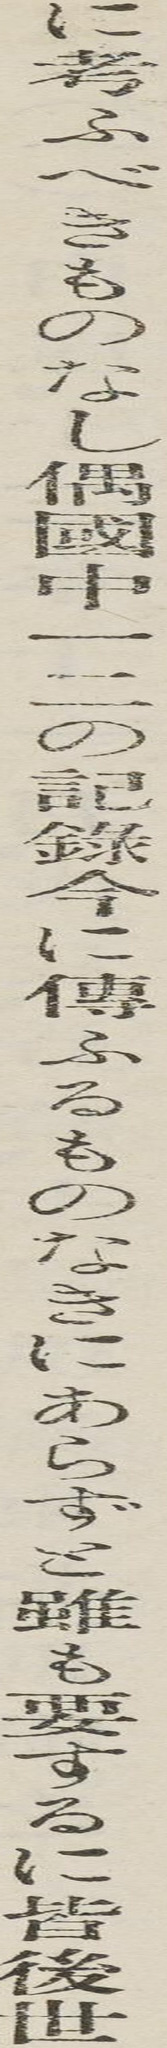に考ふべきものなし偶国中一二の記録今に伝ふるものなきにあらずと雖も要するに皆後世
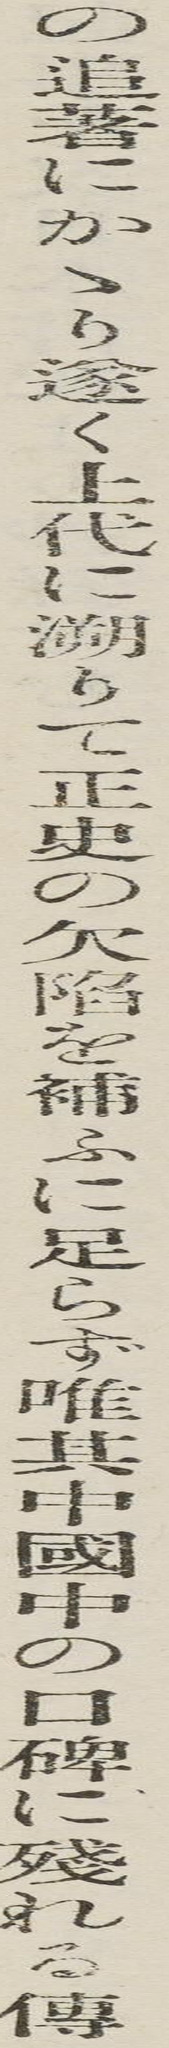の追著にかゝり遂く上代に遡りて正史の欠陥を補ふに足らず唯其中国中の口碑に残れる伝
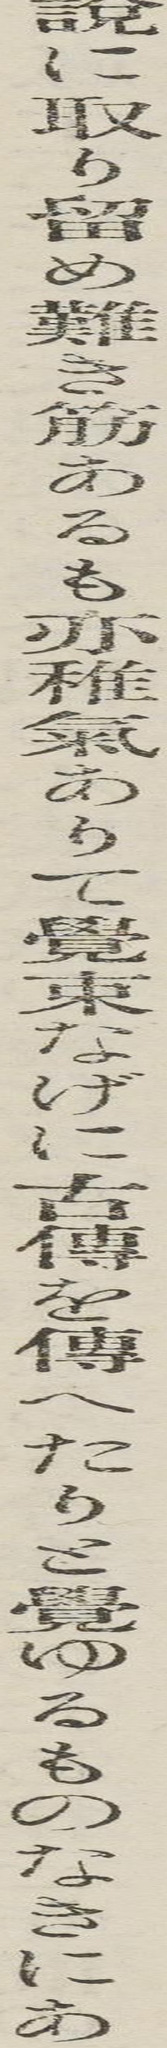説に取り留め難き筋あるも亦稚気ありて覚束なげに古伝を伝へたりと覚ゆるものなきにあ
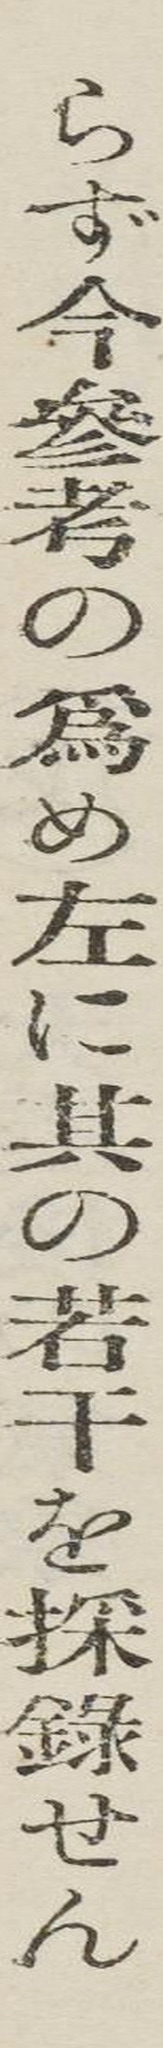らず今参考の為め左に其の若干を採録せん
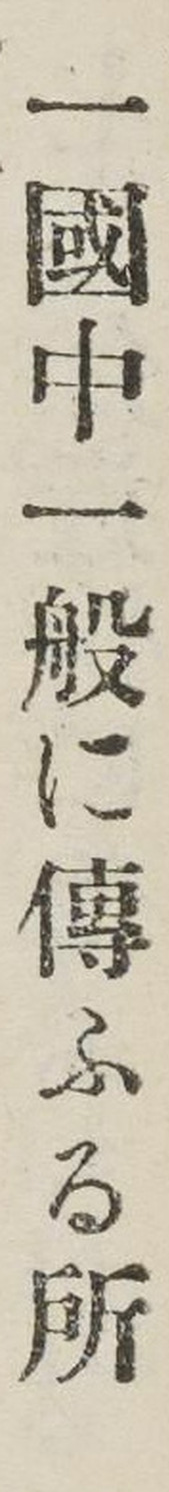㈠国中一般に伝ふる所
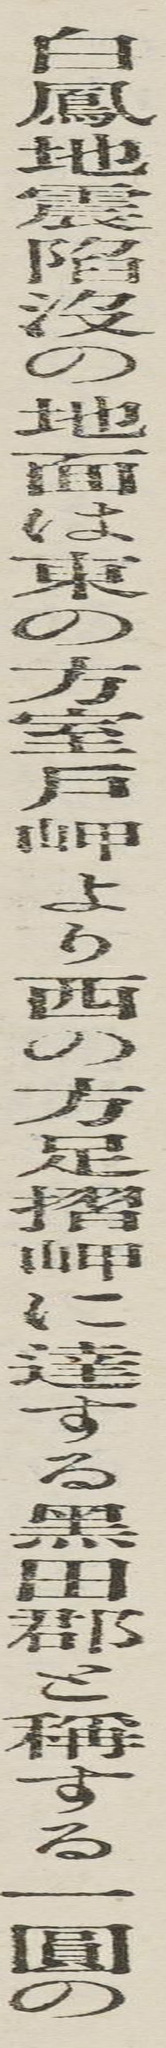白鳳地震陥没の地面は東の方室戸岬より西の方足摺岬に達する黒田郡と称する一円の
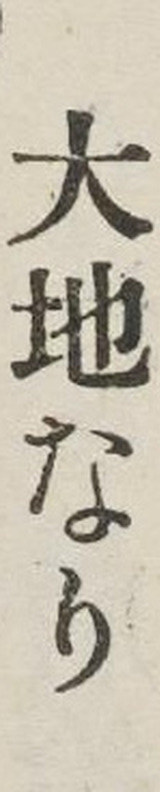大地なり
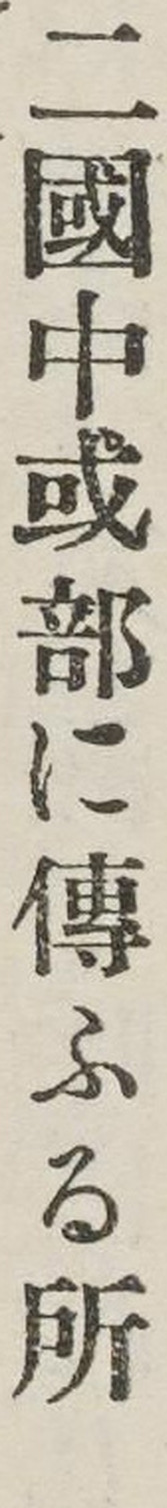㈡国中或部に伝ふる所
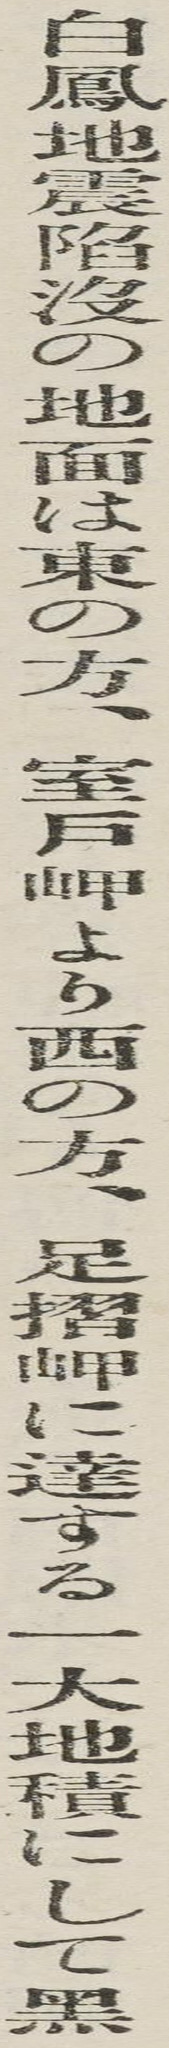白鳳地震陥没の地面は東の方、室戸岬より西の方、足摺岬に達する一大地積にして黒
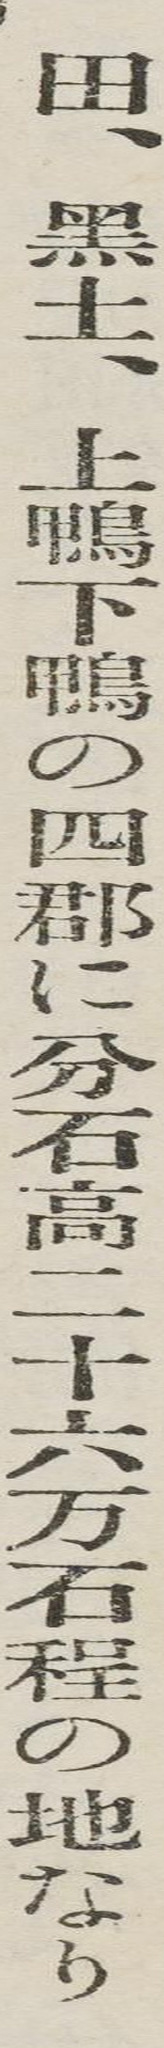田、黒土、上鴨下鴨の四郡に分石高二十六万石程の地なり
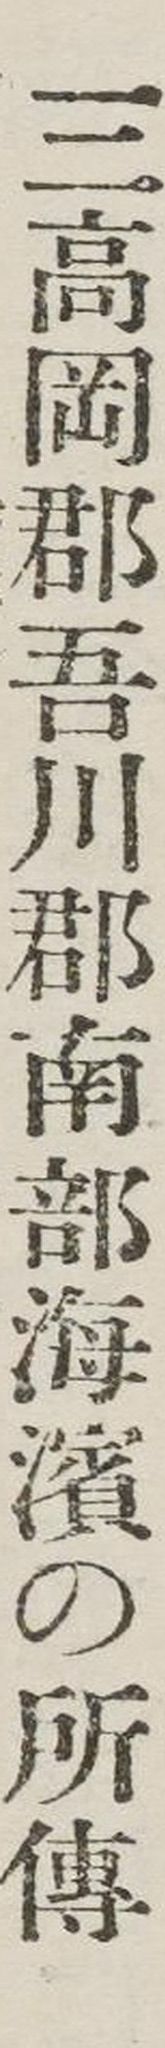㈢高岡郡吾川郡南部海浜の所伝
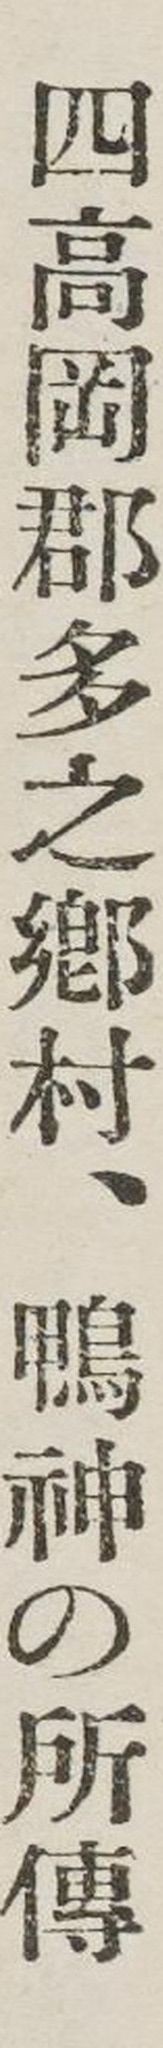㈣高岡郡多之郷村、鴨神の所伝
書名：土佐古今ノ地震
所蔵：東京大学地震研究所図書室 Earthquake Research Institute Library, The University of Tokyo, JAPAN
